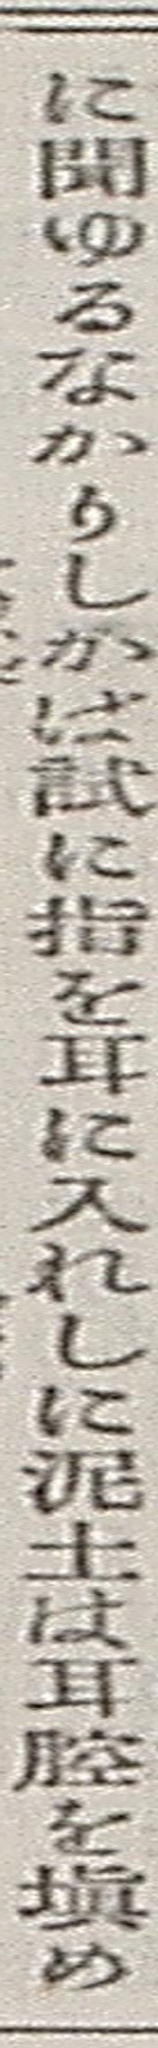に聞ゆるなかりしかば試に指を耳に入れしに泥土は耳腔を填め
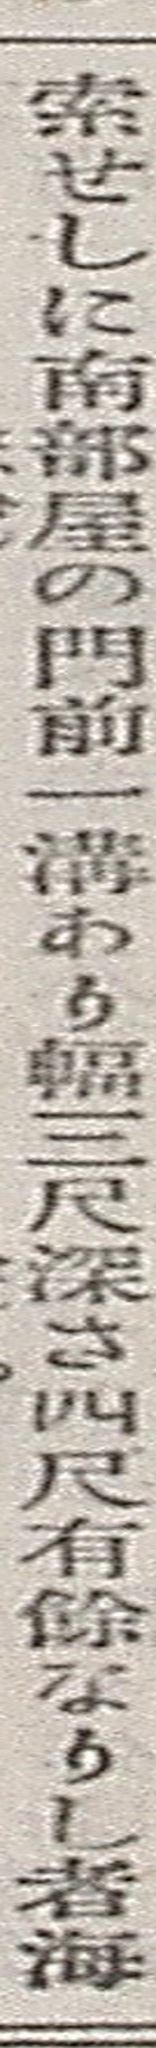索せしに南部屋の門前一溝あり幅三尺深さ四尺有余なりし者海
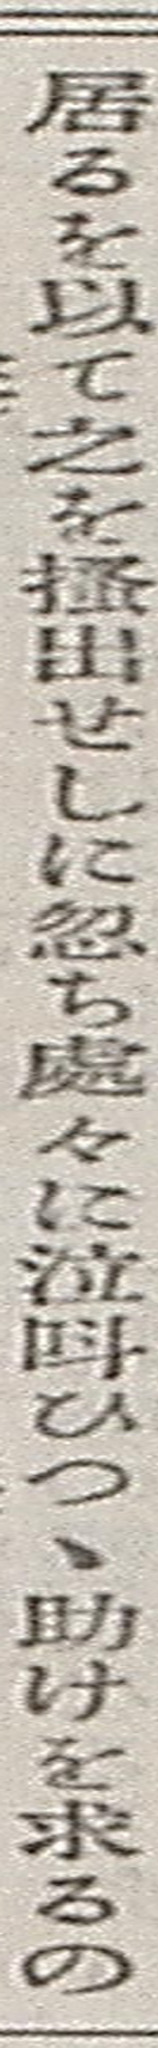居るを以て之を掻出せしに忽ち処々に泣叫ひつゝ助けを求るの
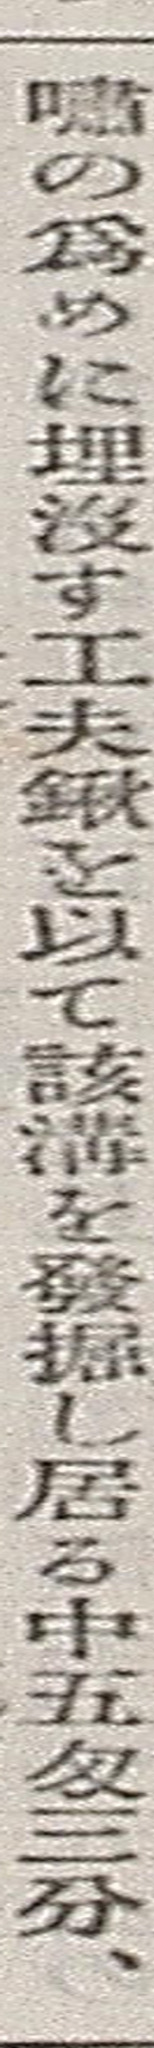嘯の為めに埋没す工夫鍬を以て該溝を発掘し居る中五匁三分、
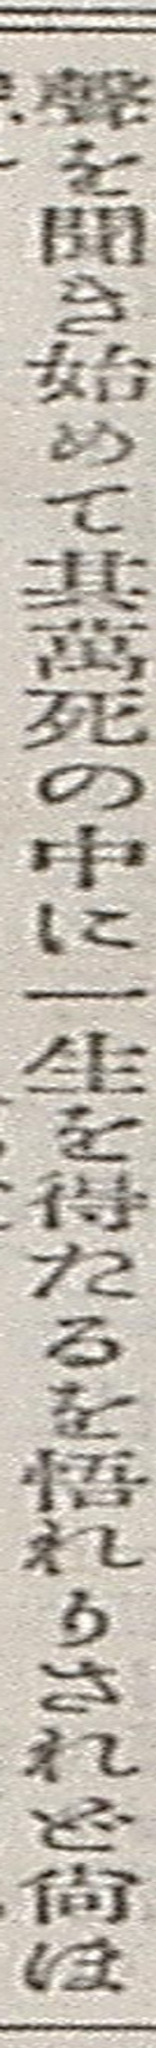声を聞き始めて其万死の中に一生を得たるを悟れりされど尚ほ
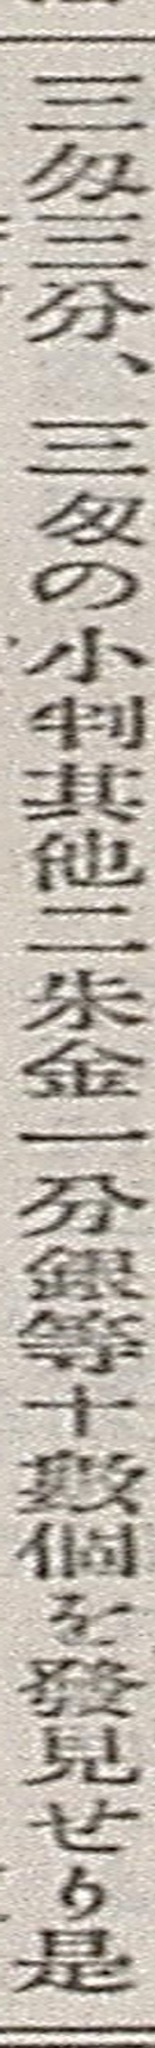三匁三分、三匁の小判其他二朱金一分銀等十数個を発見せり是
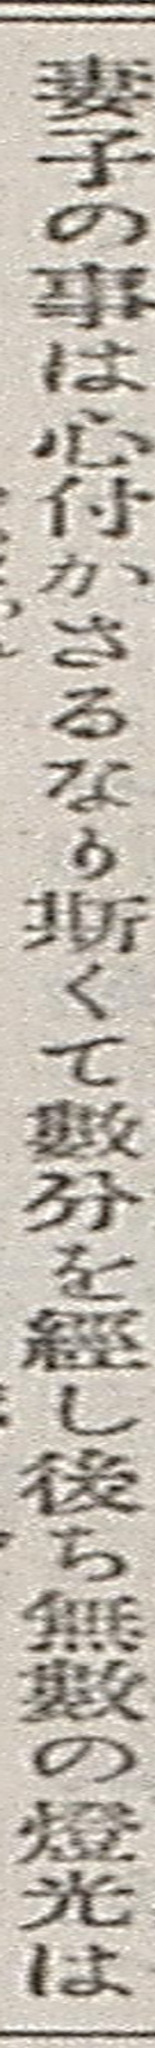妻子の事は心付かさるなり斯くて数分を経し後ち無数の灯光は
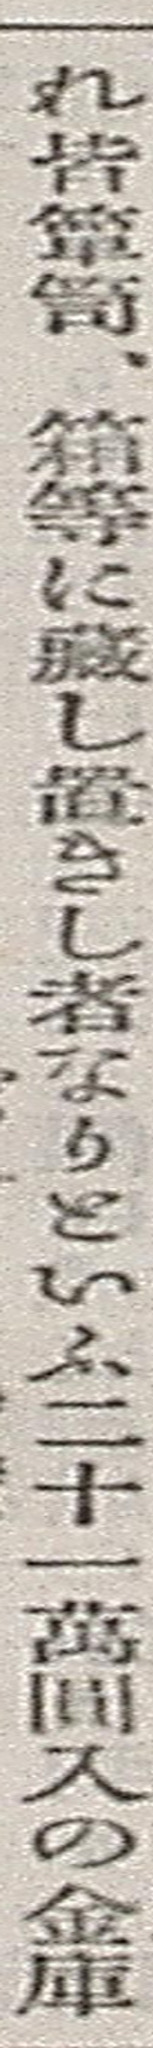れ皆箪笥、箱等に蔵し置きし者なりといふ二十一万円入の金庫
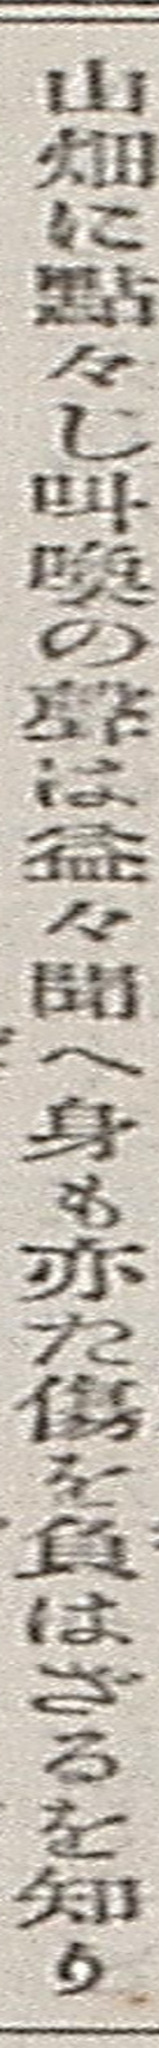山畑に点々し叫喚の声は益々聞へ身も亦た傷を負はざるを知り
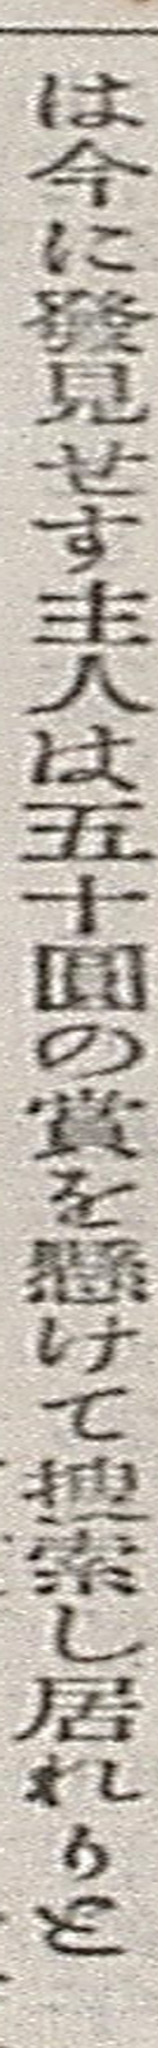は今に発見せす主人は五十円の賞を懸けて捜索し居れりと
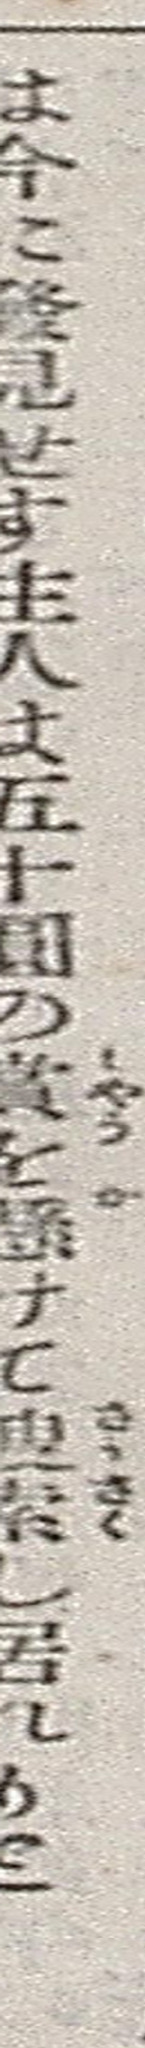は今に発見せす主人は五十円の賞を懸けて捜索し居れりと
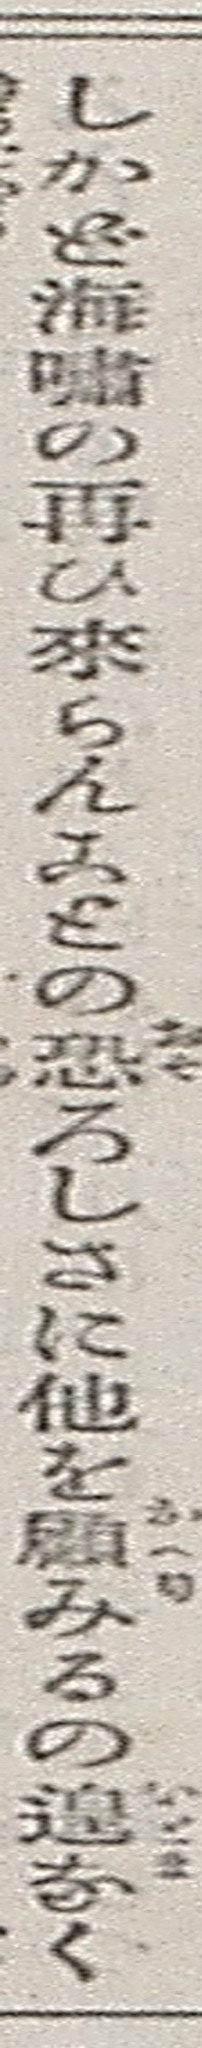しかど海嘯の再ひ来らんことの恐ろしさに他を顧みるの遑なく
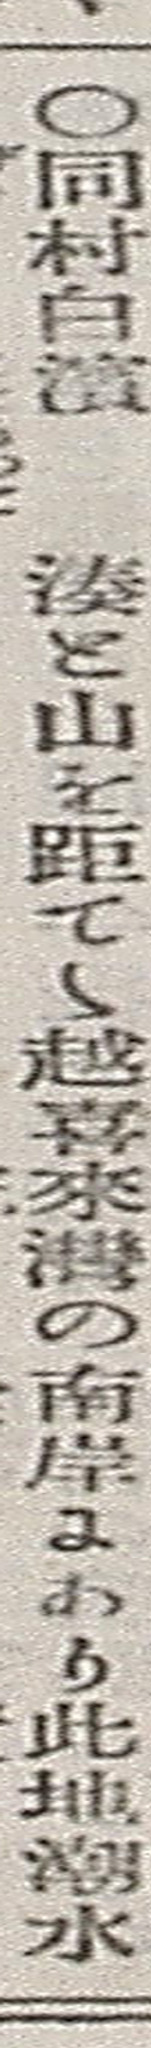○同村白浜湊と山を距てゝ越喜来湾の南岸にあり此地潮水
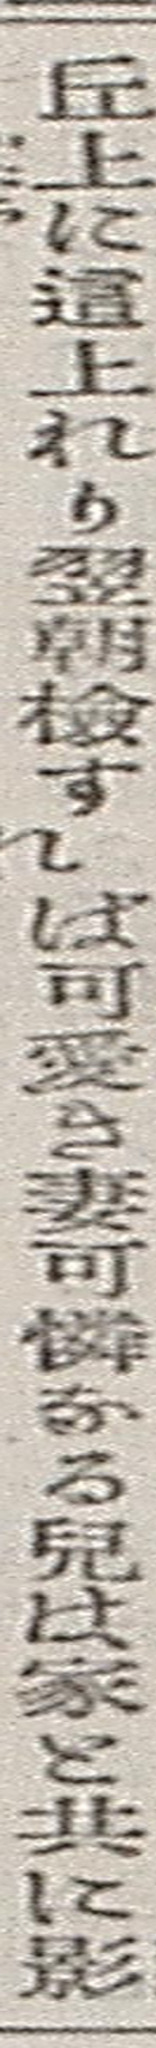丘上に這上れり翌朝検すれば可愛き妻可憐なる兒は家と共に影
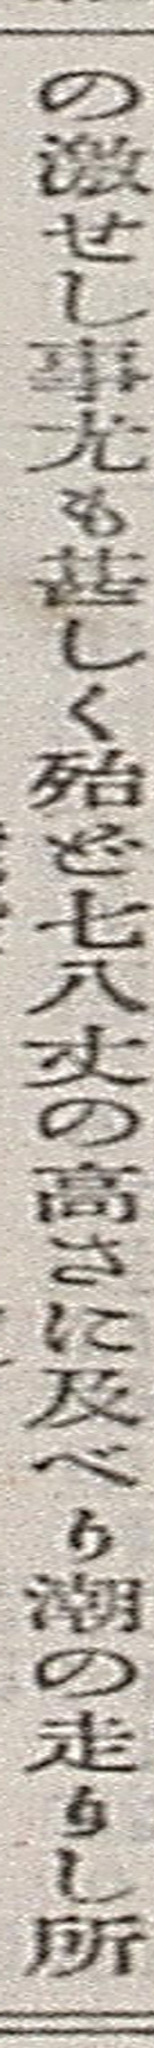の激せし事尤も甚しく殆ど七八丈の高さに及べり潮の走りし所
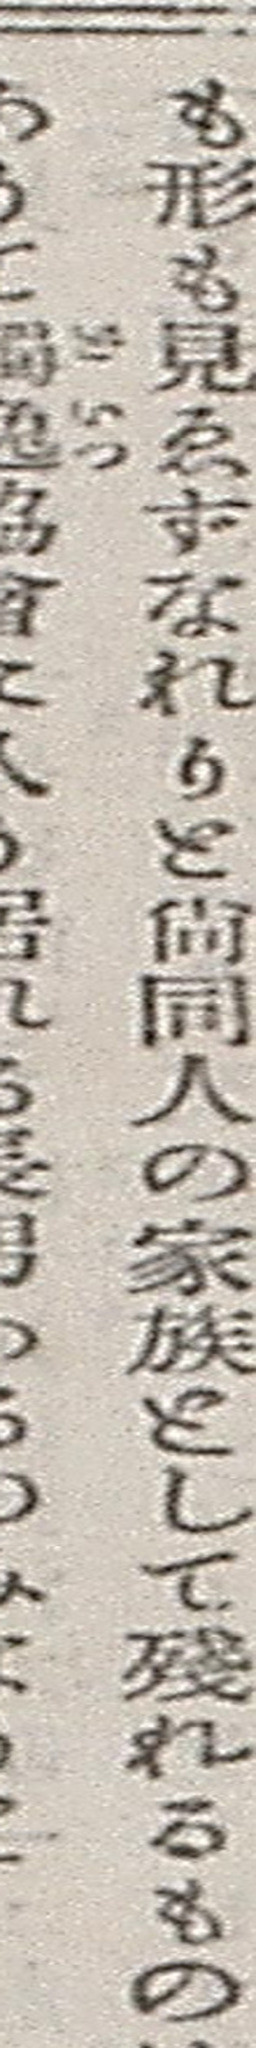ありて独逸協会に入り居れる長男あるのみなりと
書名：風俗畫報臨時増刊第百二十號　大海嘯被害録（下）
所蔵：東京大学地震研究所図書室 Earthquake Research Institute Library, The University of Tokyo, JAPAN
